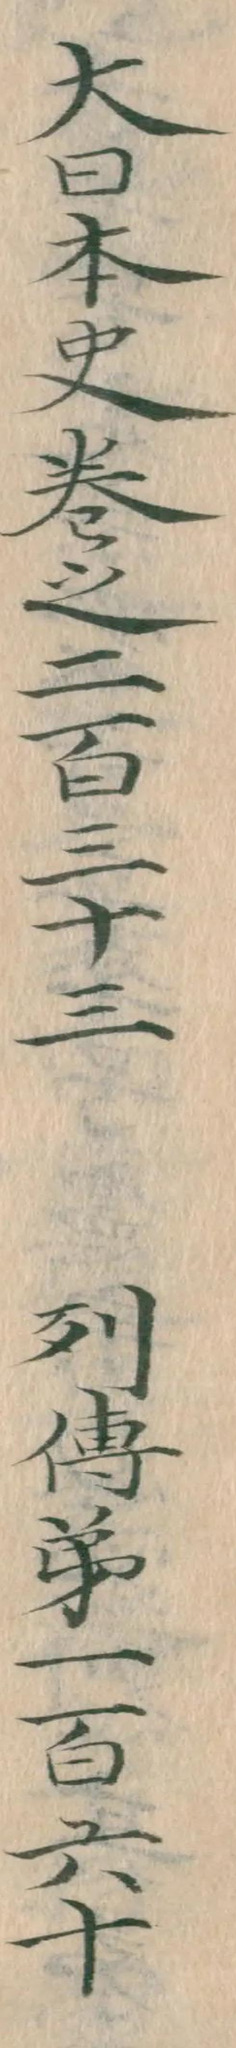大日本史巻之二百三十三列伝第一百六十
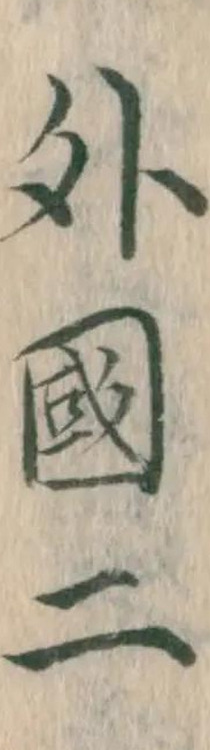外国二
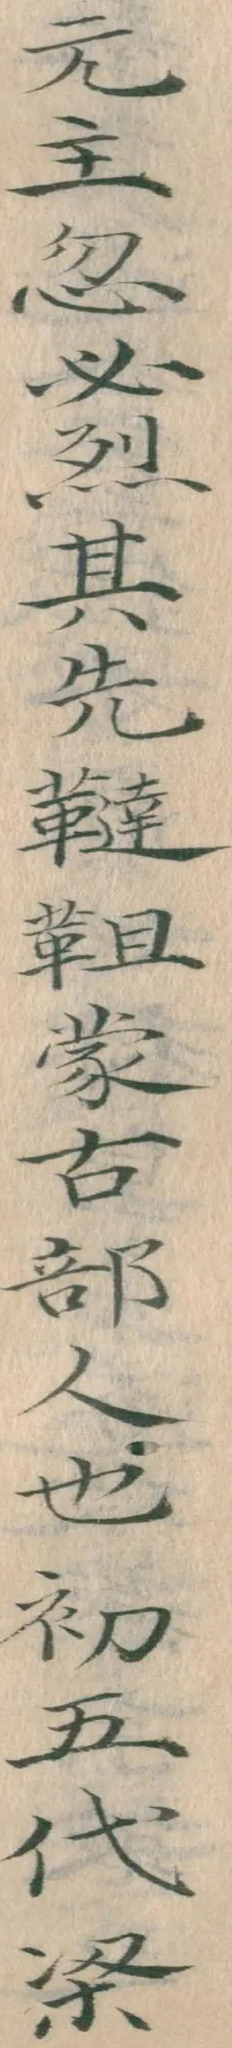元主忽必烈其先韃靼蒙古部人也初五代梁
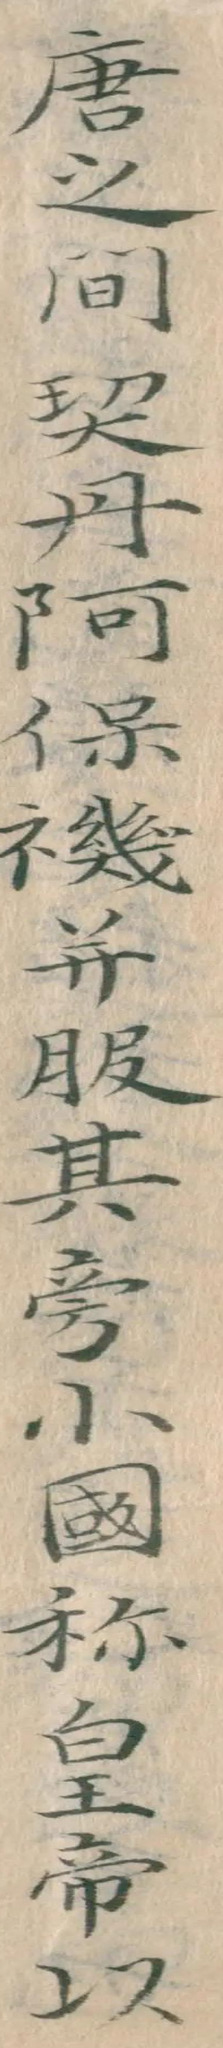唐之間契丹阿保禨并服其旁小国称皇帝以
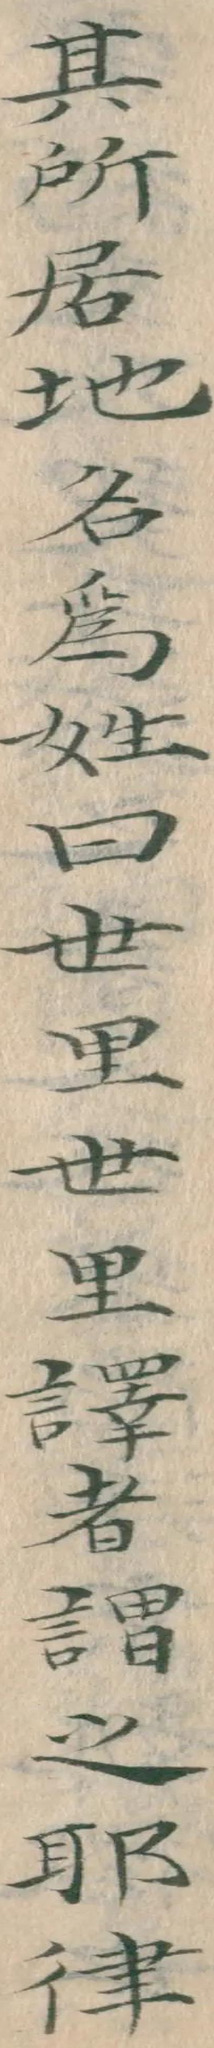其所居地名為姓曰世里世里訳者謂之耶律
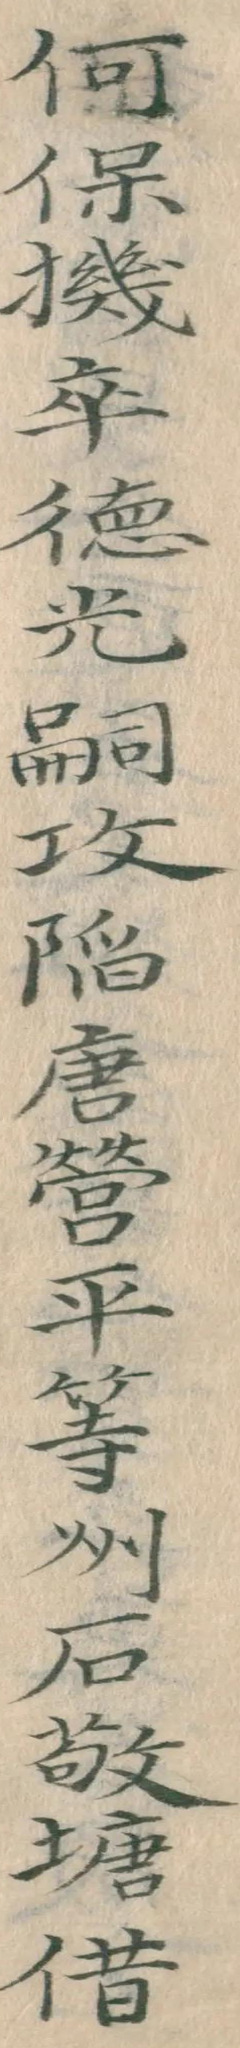阿保卒徳光嗣攻陥唐営平等州石敬塘借
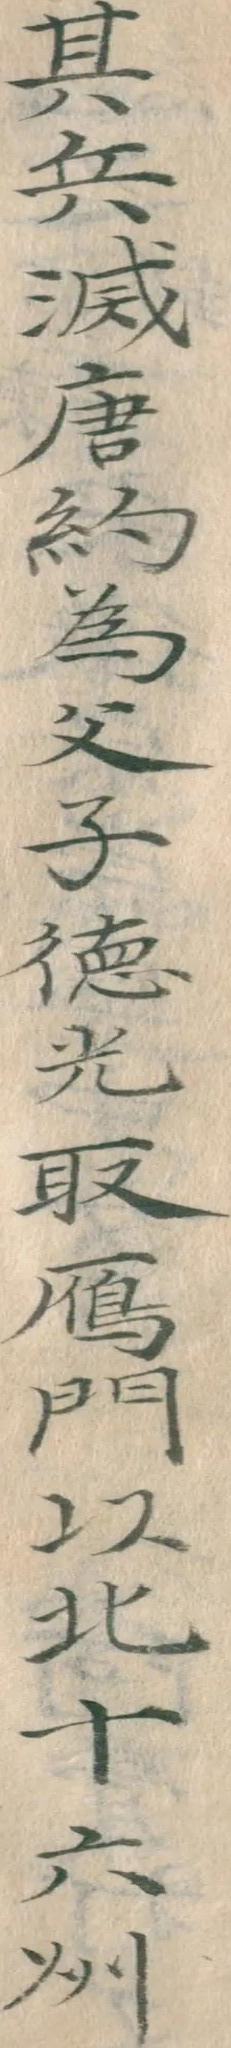其兵滅唐約為父子徳光取鴈門以北十六州
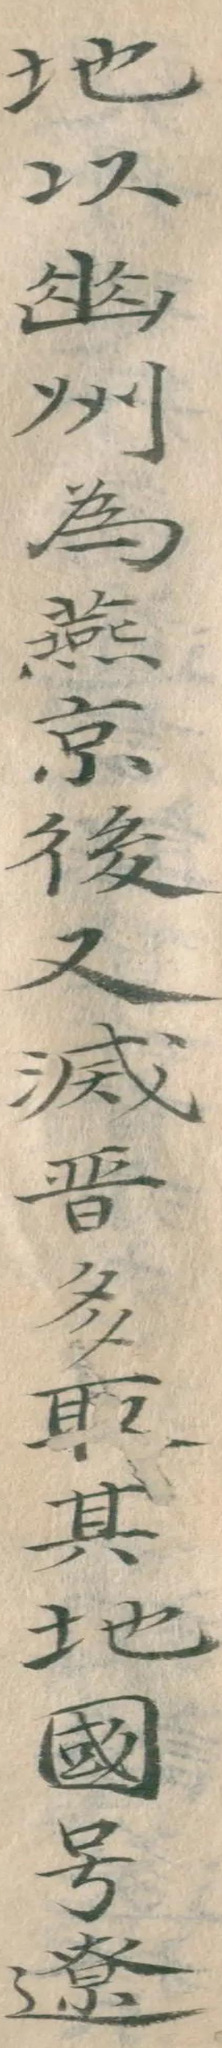地以幽州為燕京後又滅晋多取其地国号遼
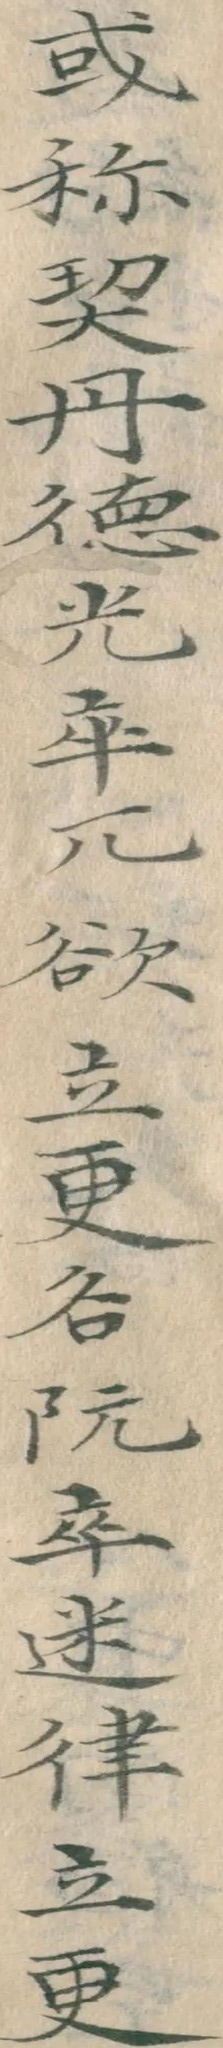或称契丹徳光卒兀欲立更名阮卒迷律立更
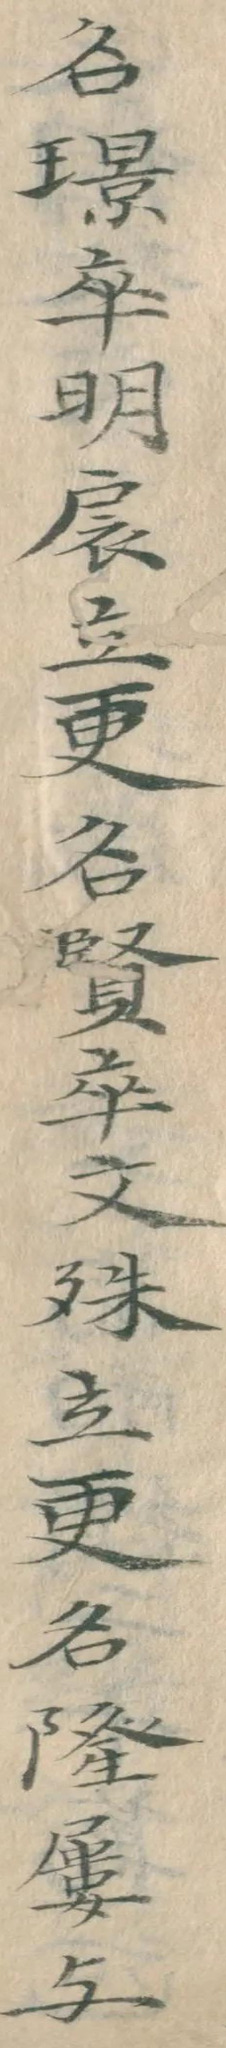名璟卒明扆立更名賢卒称文殊立更名屡与

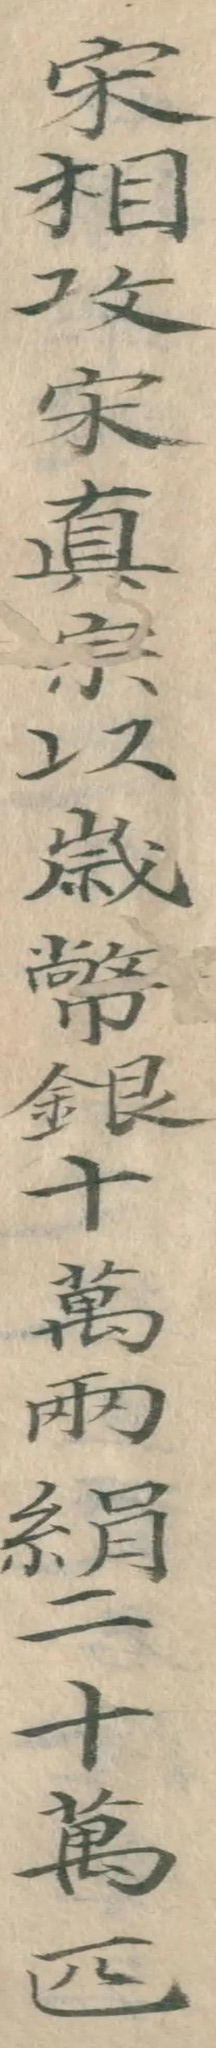宋相攻宋真宗以歳幤銀十万両絹二十万匹
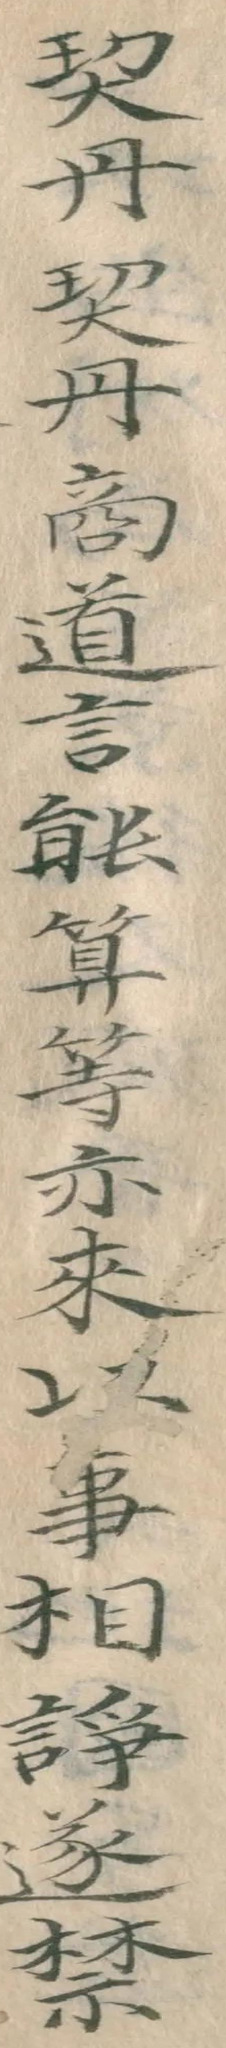契丹契丹商道言能算等亦来以事相諍遂禁
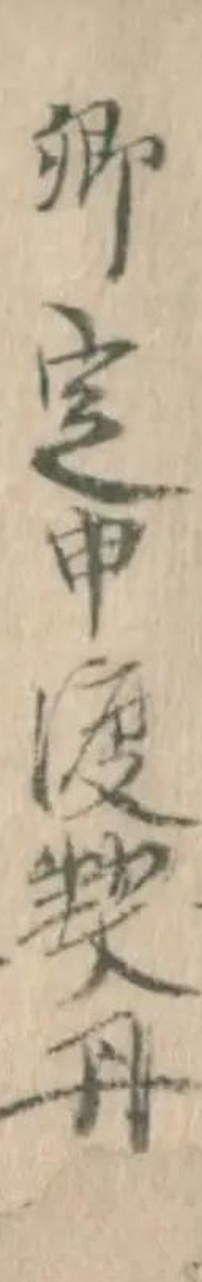郷定申渡契丹
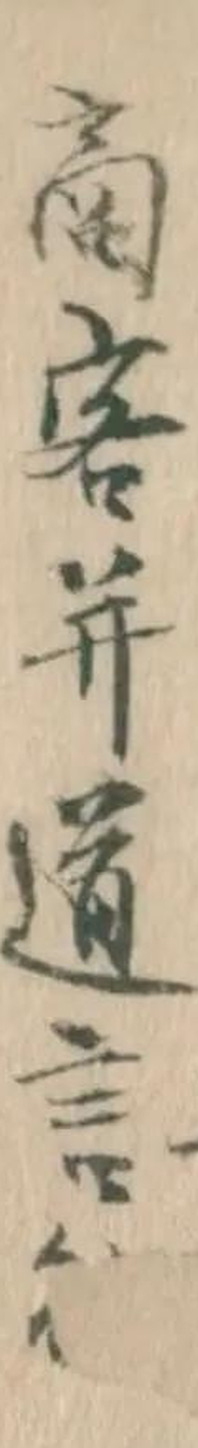商客并道言
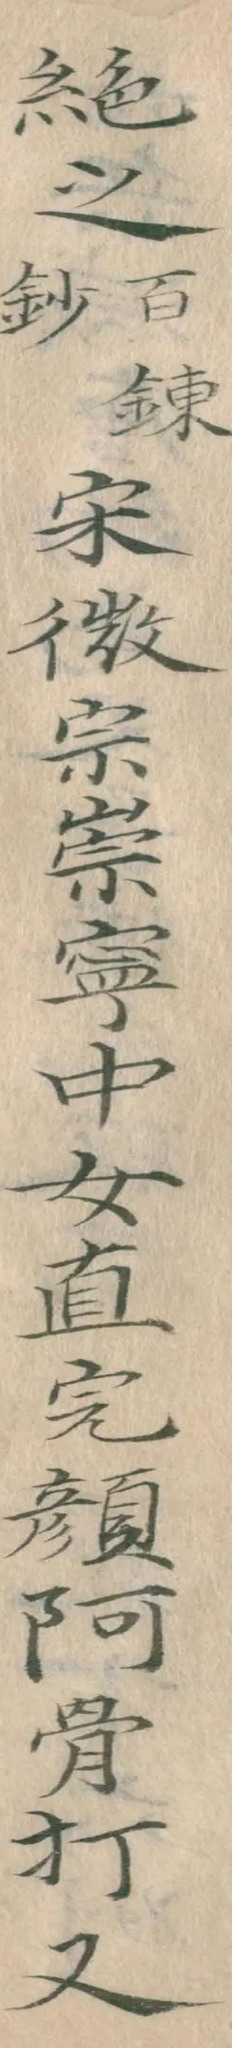絶之百錬鈔宋微宗崇寧中女直完顔阿骨打又
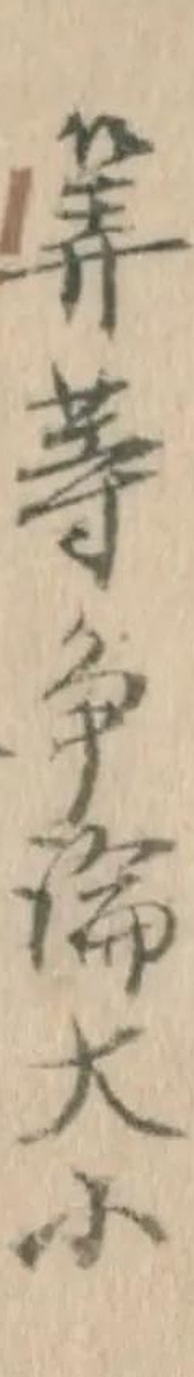筭等争論大小
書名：輪池叢書. 12
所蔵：国立国会図書館 National Diet Library, JAPAN
